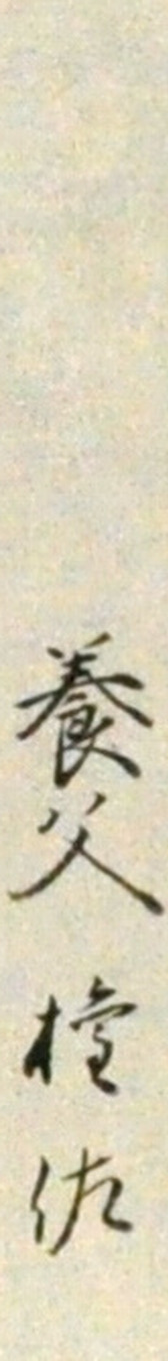養父権佐
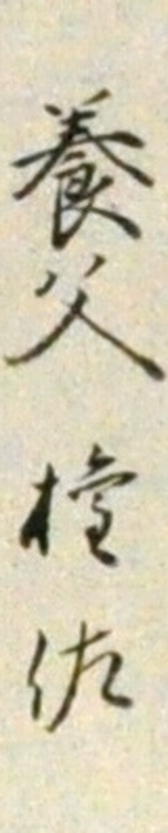養父権佐
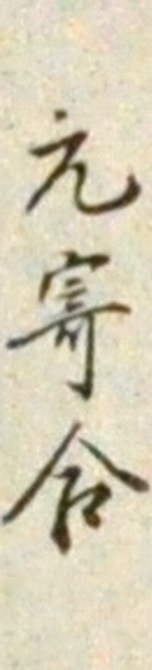元寄合
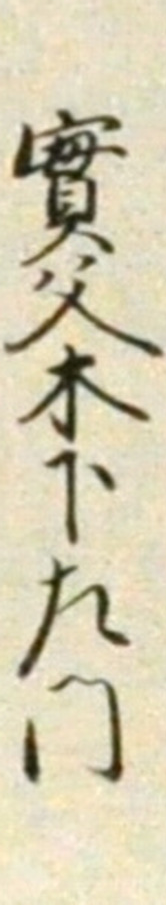實父木下左門
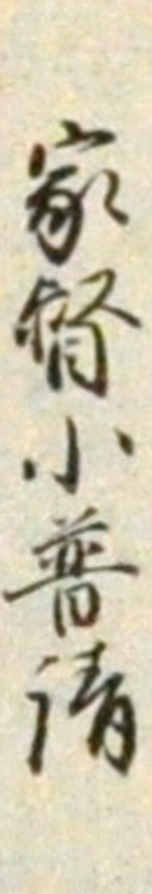家督小普請
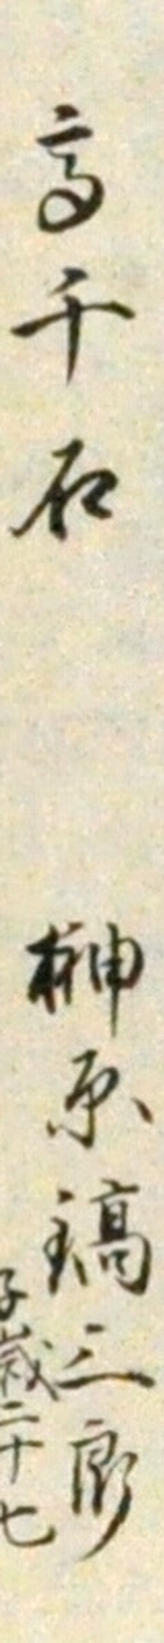高千石榊原鎬三郎
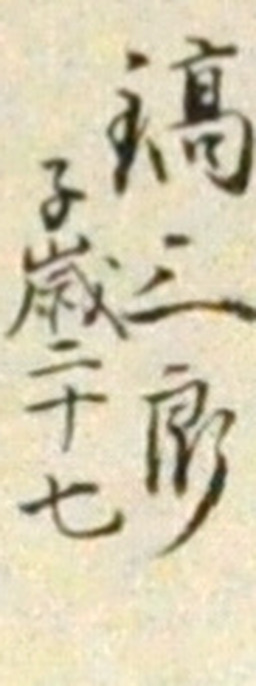子歳二十七
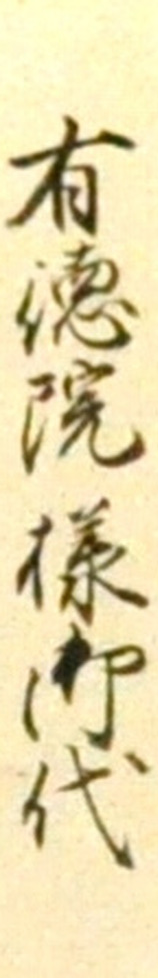有徳院様御代
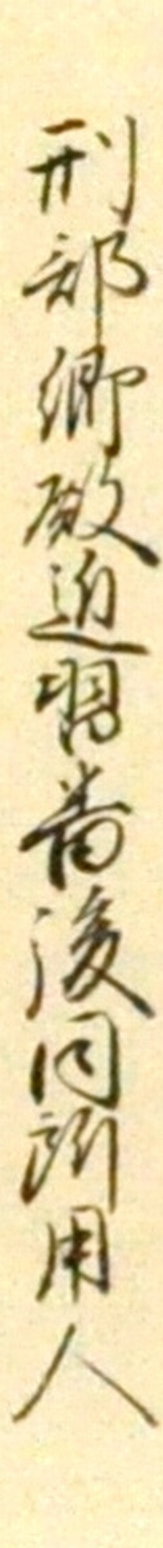刑部卿殿近習番後同所用人
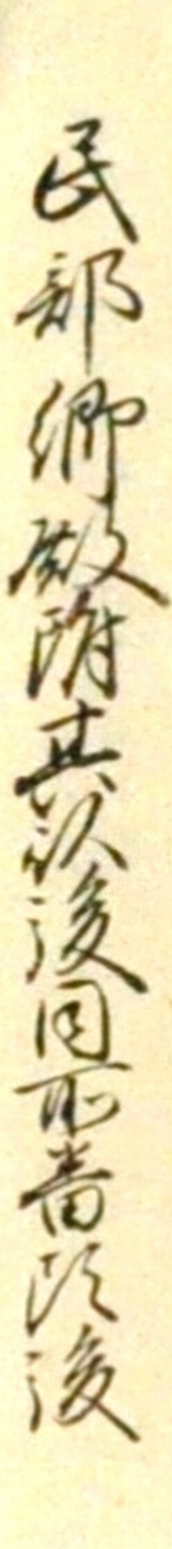民部卿殿附其以後同所番頭後

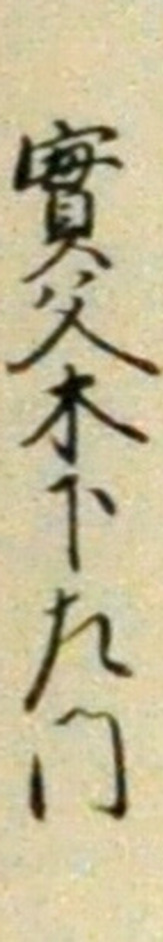實父木下左門
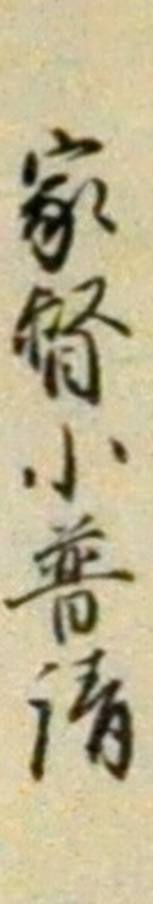家督小普請
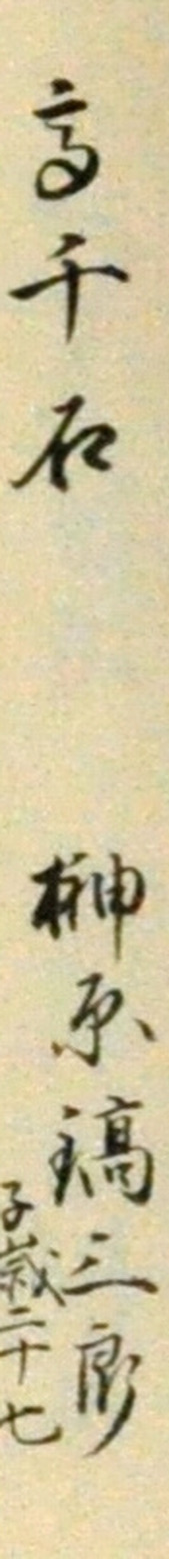高千石榊原鎬三郎
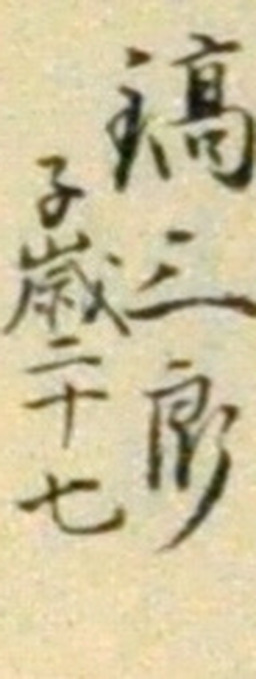子歳二十七
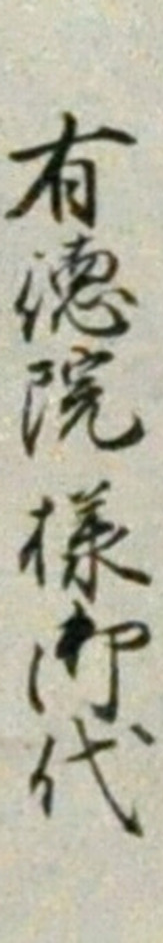有徳院様御代
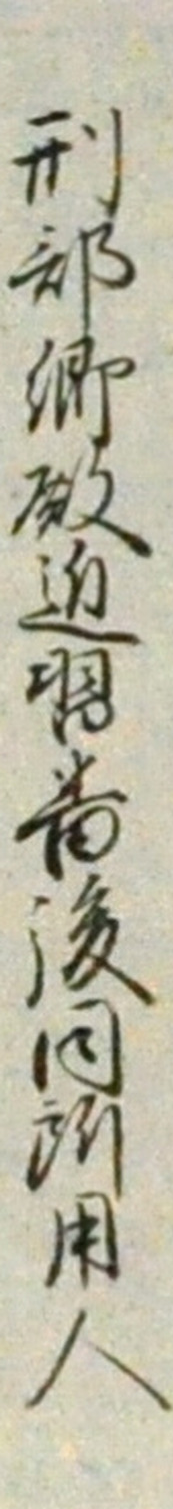刑部卿殿近習番後同所用人
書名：若年寄御役中御調書付
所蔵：伊那市立高遠町図書館・合同会社AMANE
